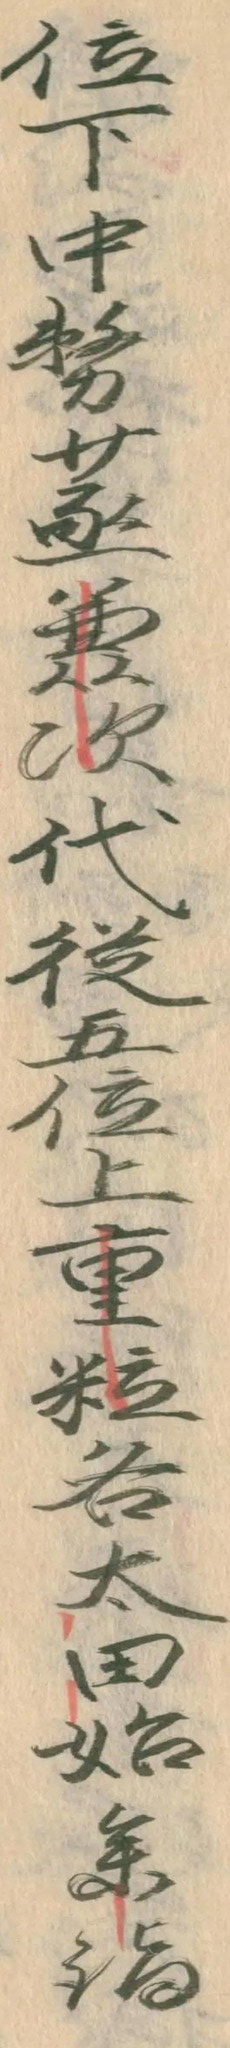位下中務少丞兼次代従五位上重粒各太_田_始参-詣
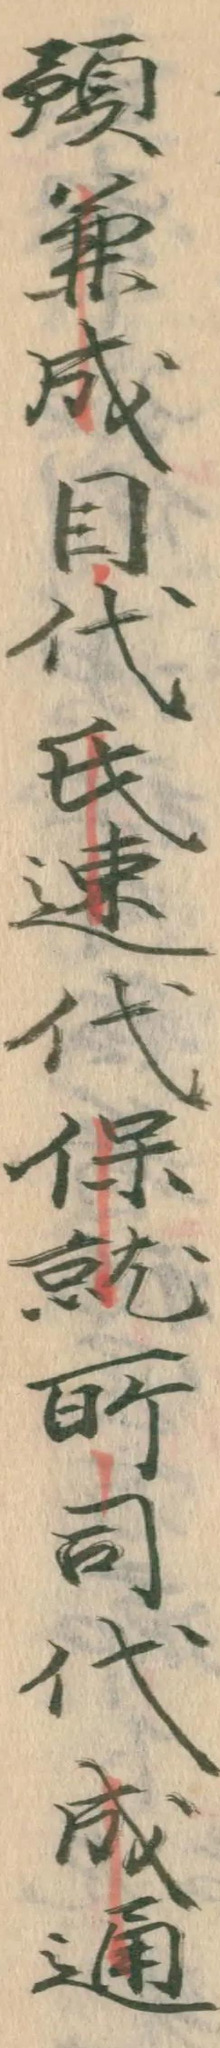預兼成目-代氏速代保就所-司代成通

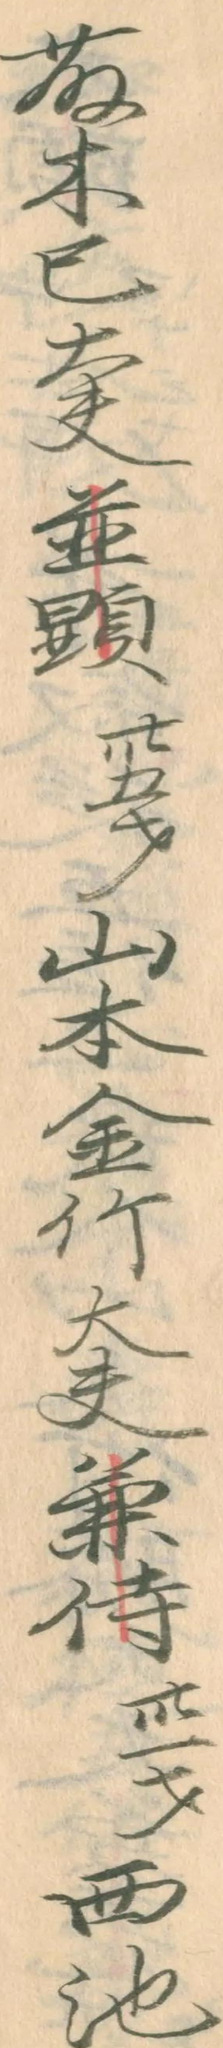藤木巳大夫並顕卅五才山本金竹大夫兼侍卅一才西池
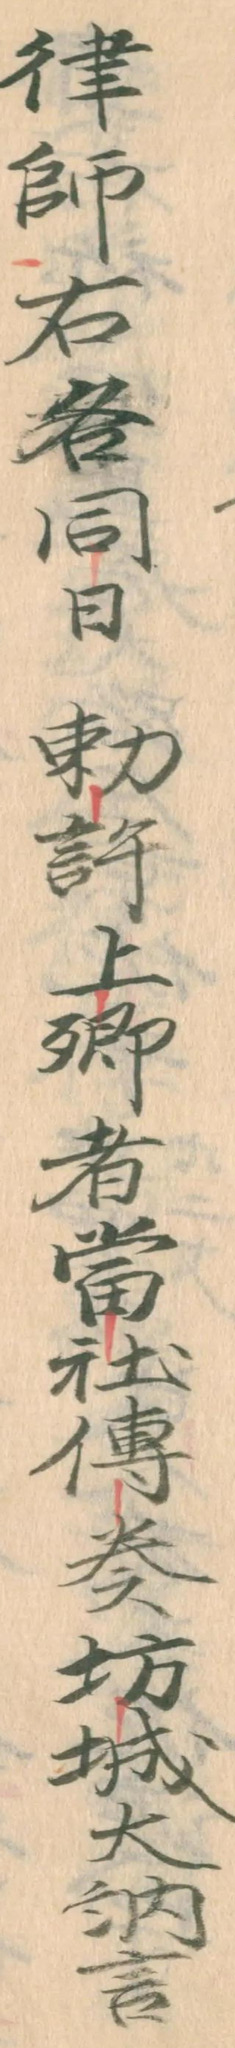律師右各同-日勅-許上-卿者当-社伝-奏坊-城大納言
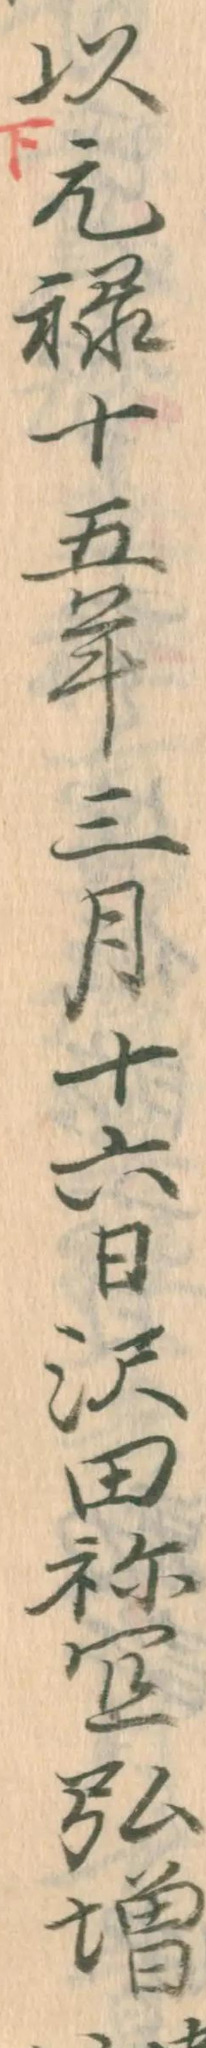元禄十五年三月十六日沢田祢宜
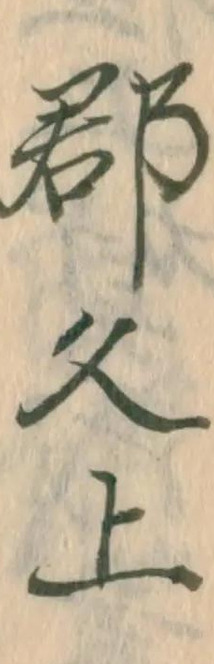郡久上
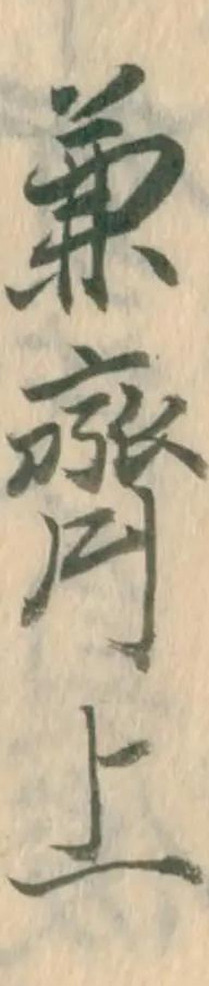兼齊上

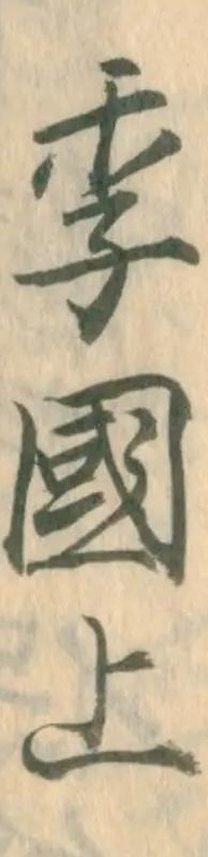季国上
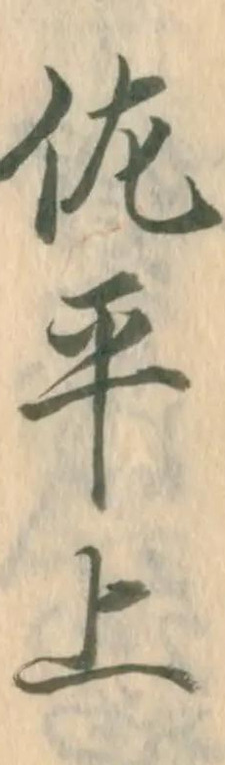佐平上
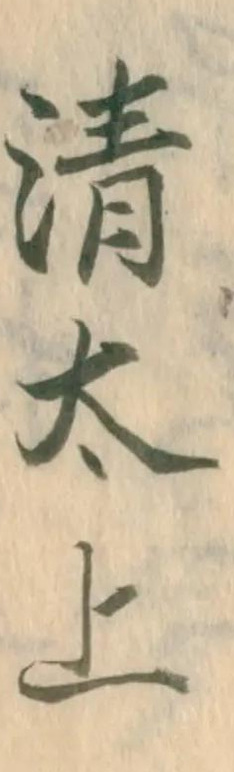清太上
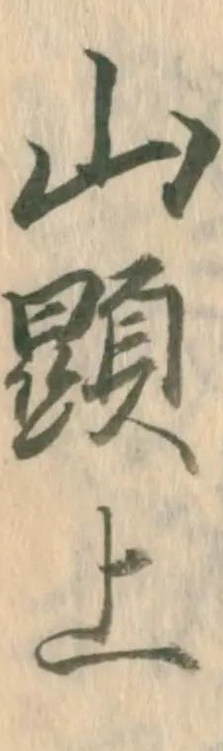山顕上
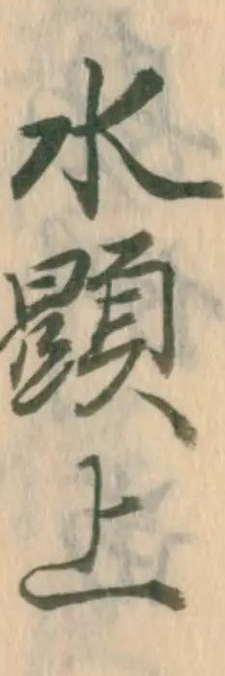水顕上
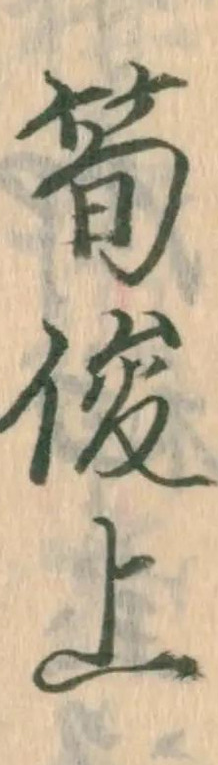筍俊上
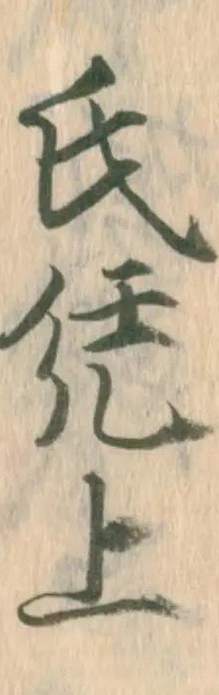氏凭上
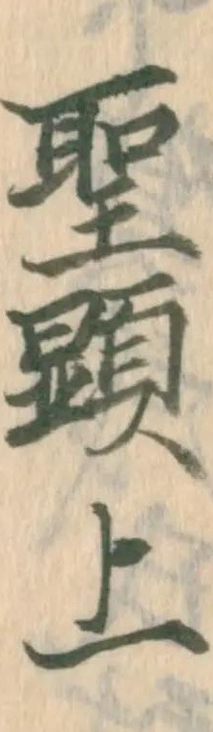聖顕上
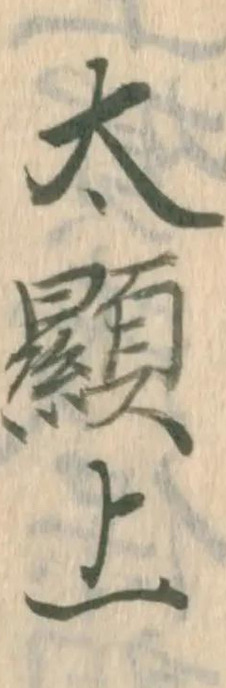太顕上
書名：賀茂社記録. 第16冊
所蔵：国立国会図書館 National Diet Library, JAPAN
